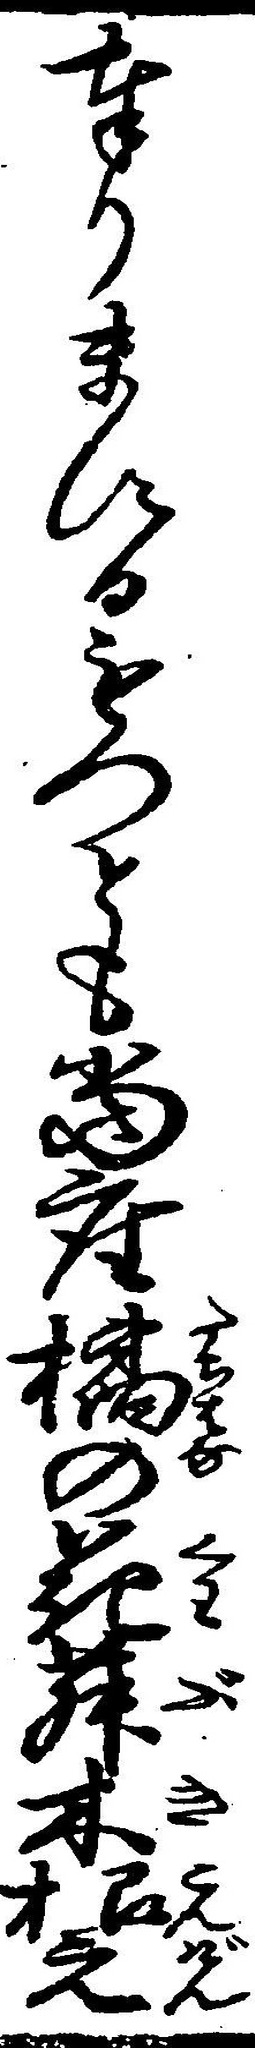奉りまするもつとも当座橘の花舞木根元
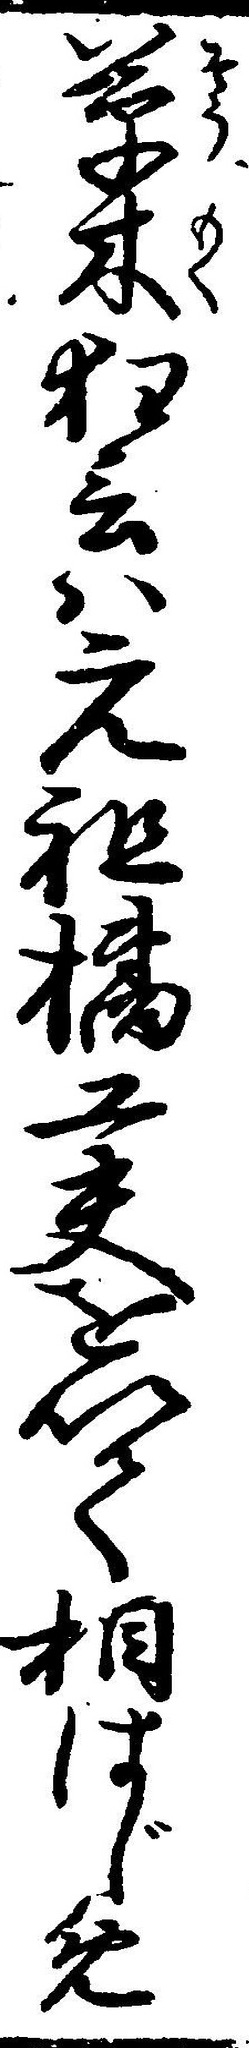草木狂言は元祖橘工夫をいて相はじめ
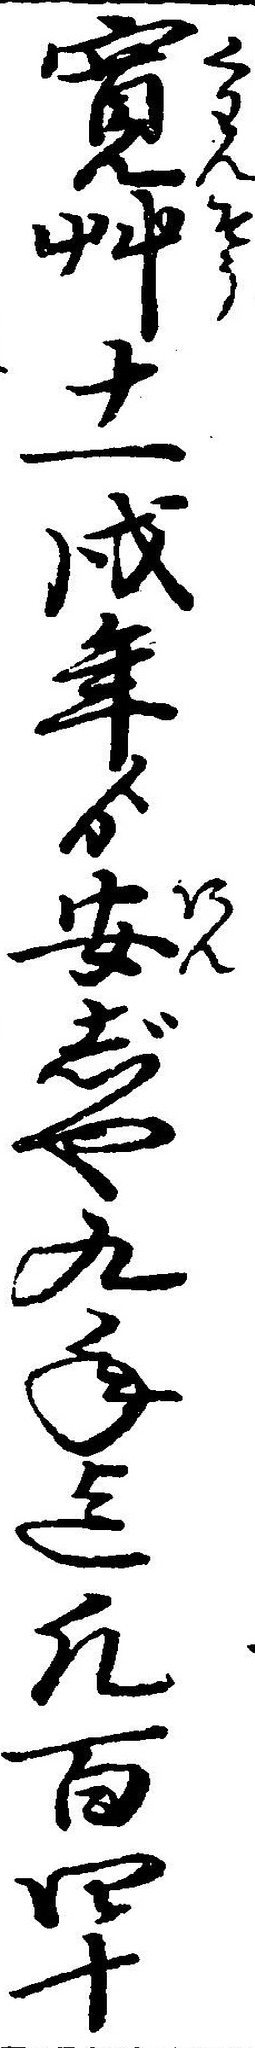寛草十一戌年ゟ安じや九年迄凡百四十
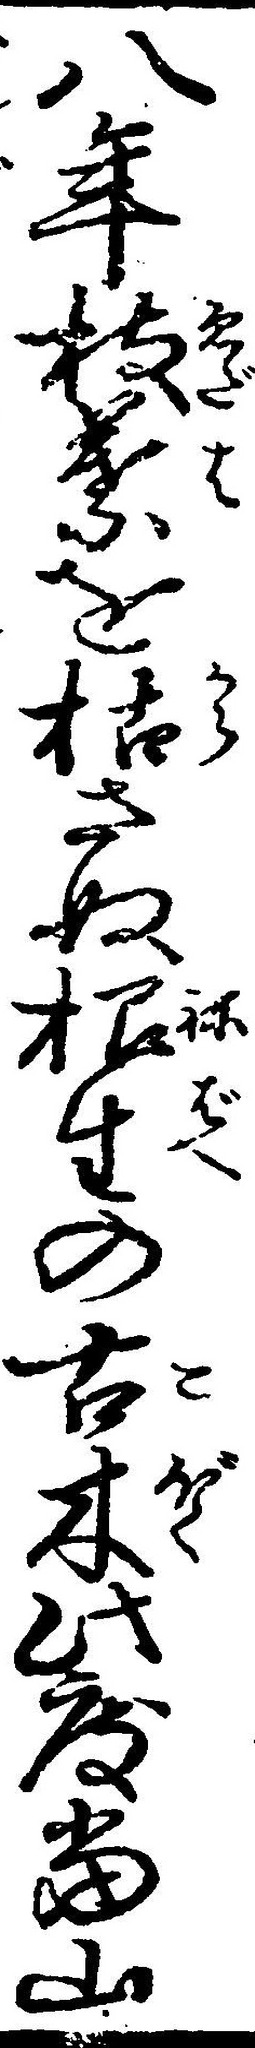八年枝葉を枯さぬ根生の古木此度唐山
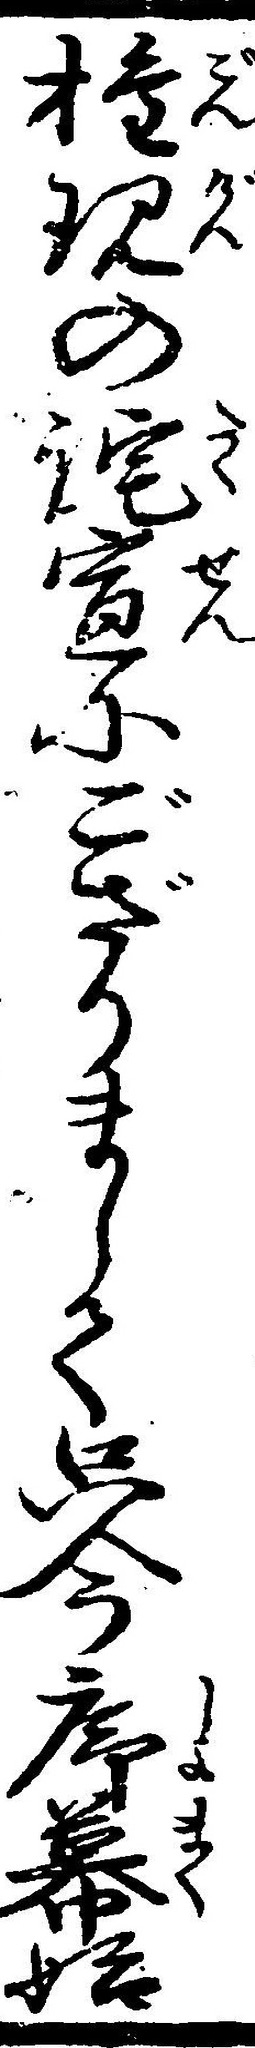権現の託宣にござりまして只今序幕始
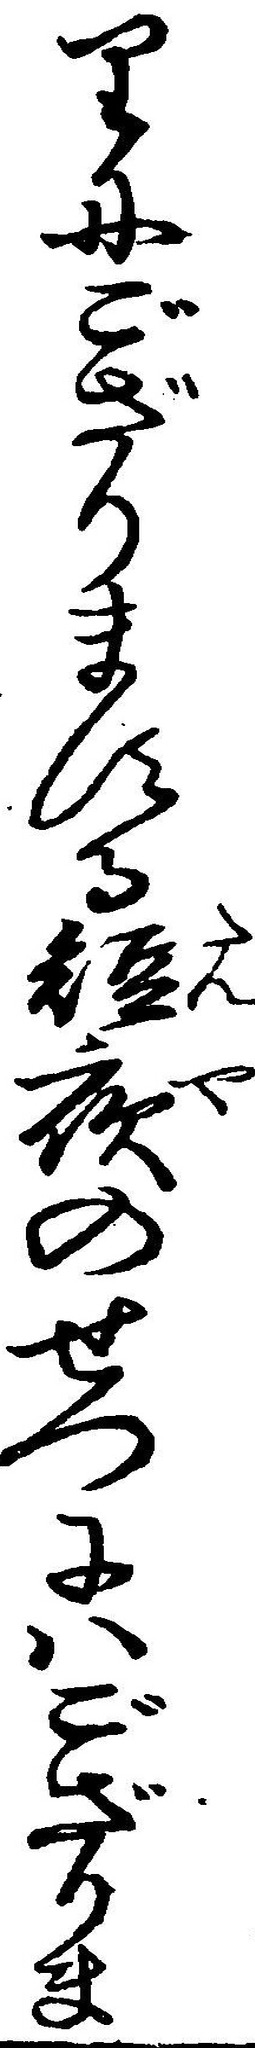りにござりまする短夜のせつにはござりま
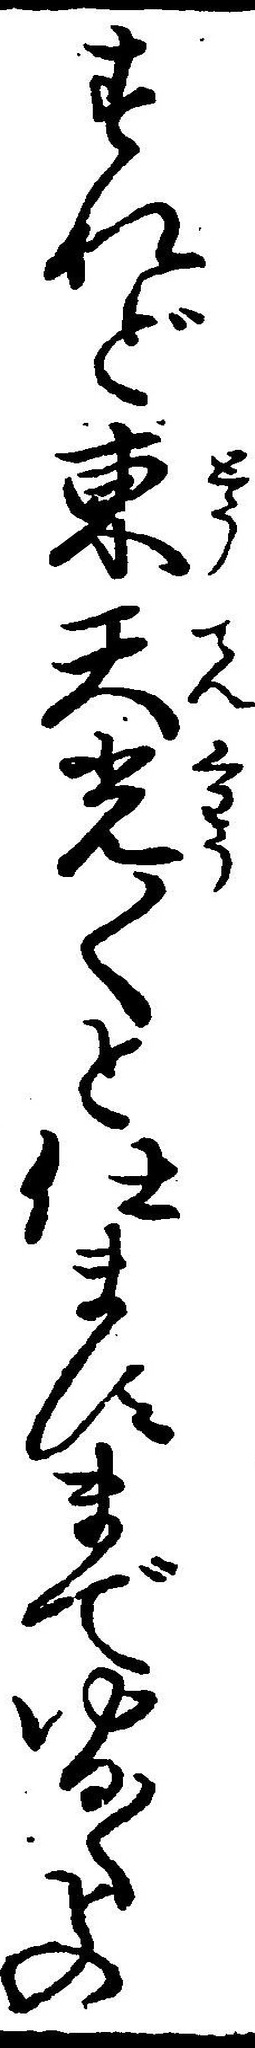すれど東天光〳〵と仕ますまでゆる〳〵との
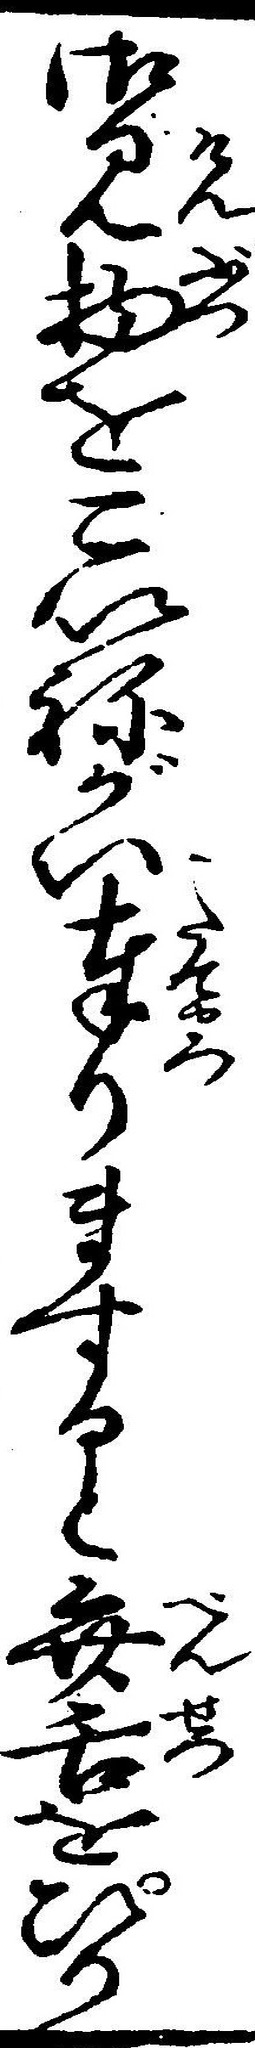御見物をこいねがい奉りますると弁舌をぴり
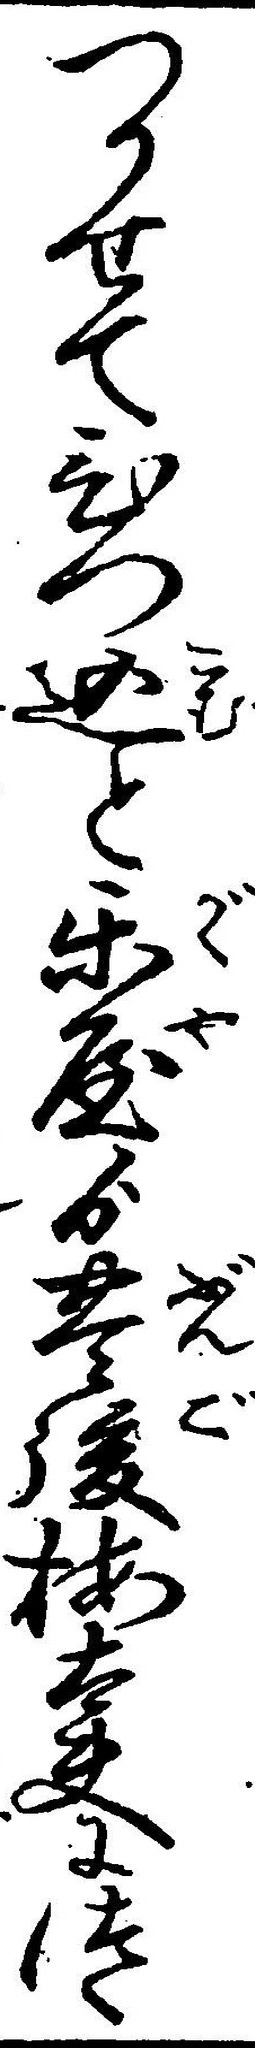つかせてひつ込と楽屋ゟ豊後梅太夫につゝ
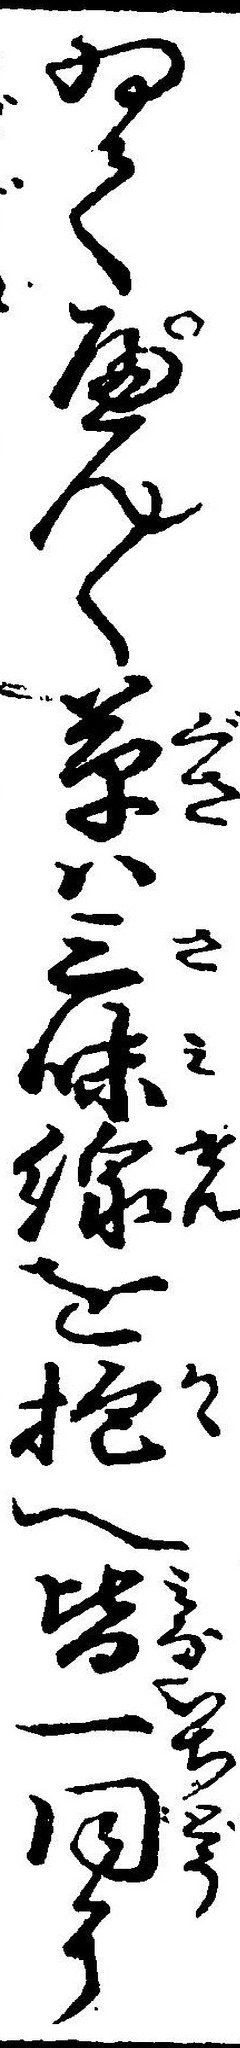ゐてぺん〳〵草は三味線を抱へ皆一同に
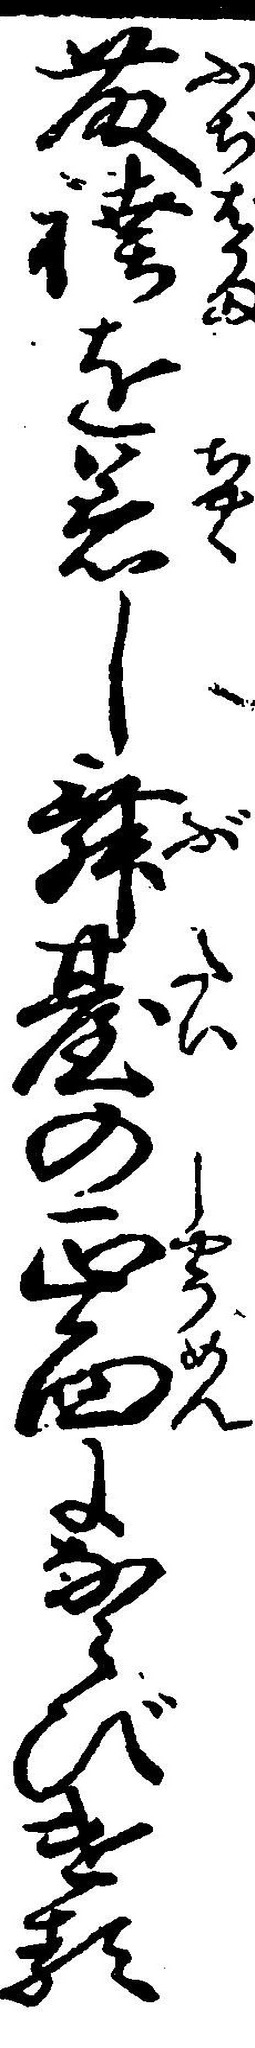藤袴を着し舞台の正面にならびける
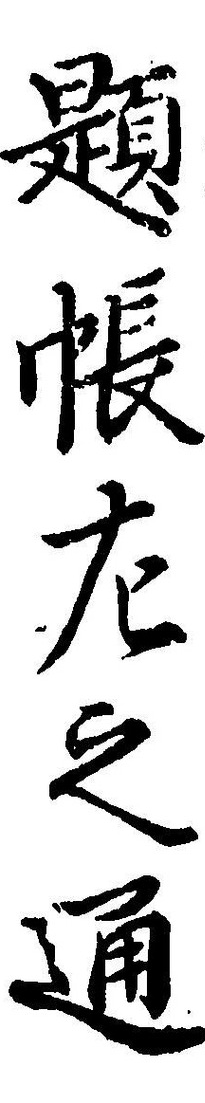題帳左之通

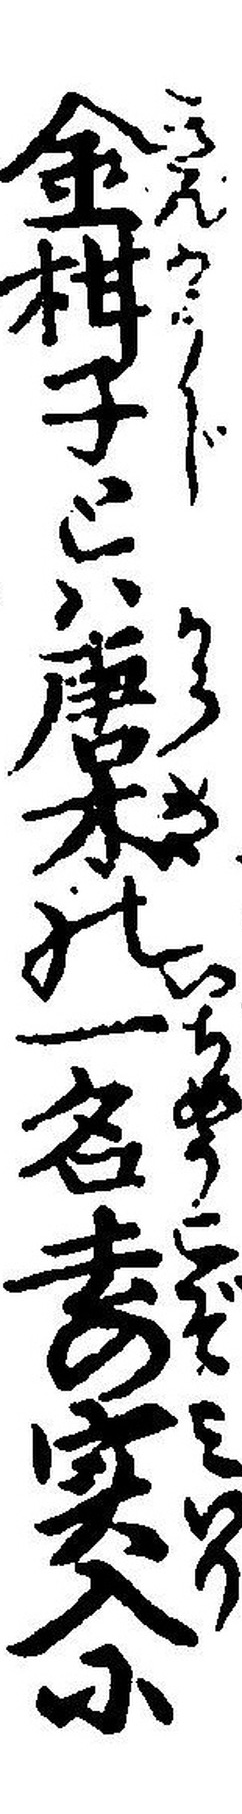金柑子とは唐木の一名去の実入に
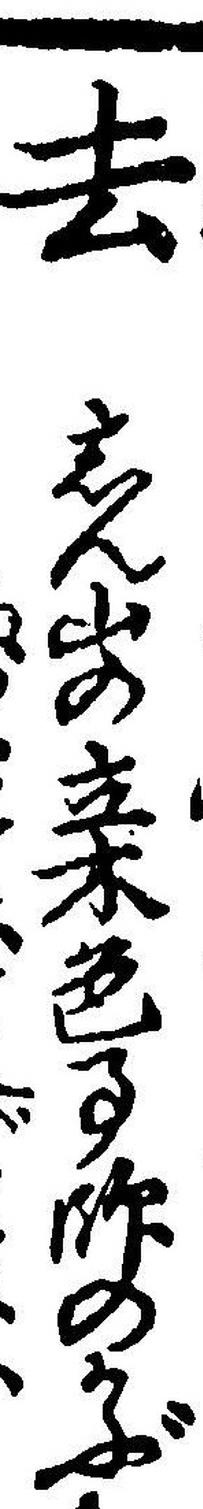しん山の立木色事師のかぶを
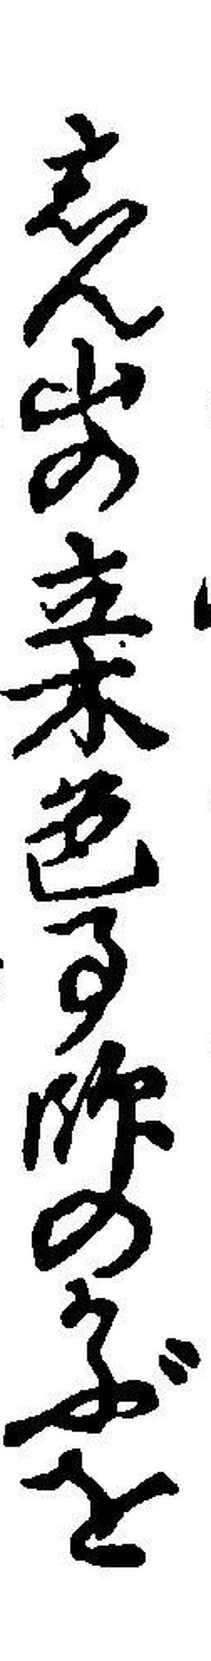しん山の立木色事師のかぶを
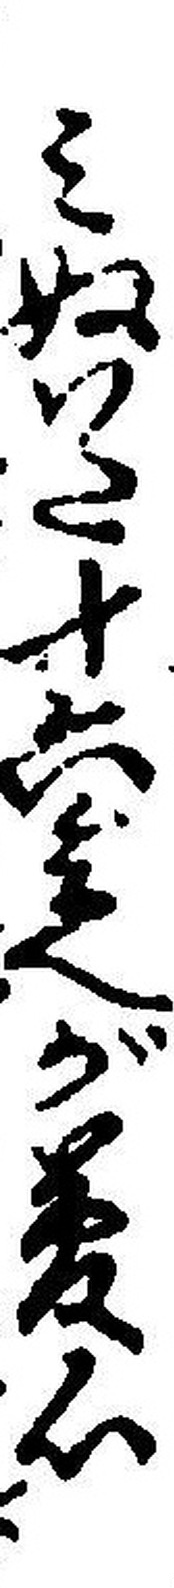みぬいた十六兵衛が夢心
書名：草木芝居化物退治 / 泉花堂三蝶(十六兵衛)作
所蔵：東京大学総合図書館 General Library in the University of Tokyo, JAPAN
